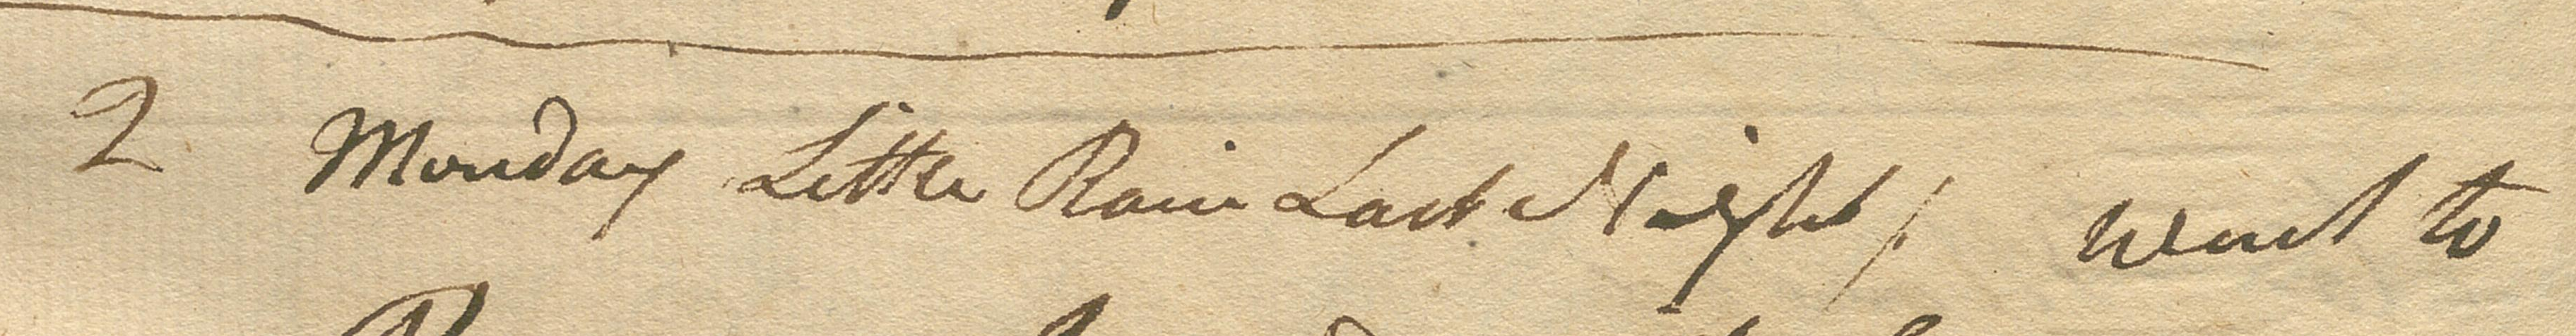2 Monday Little Rain Last Night; went to
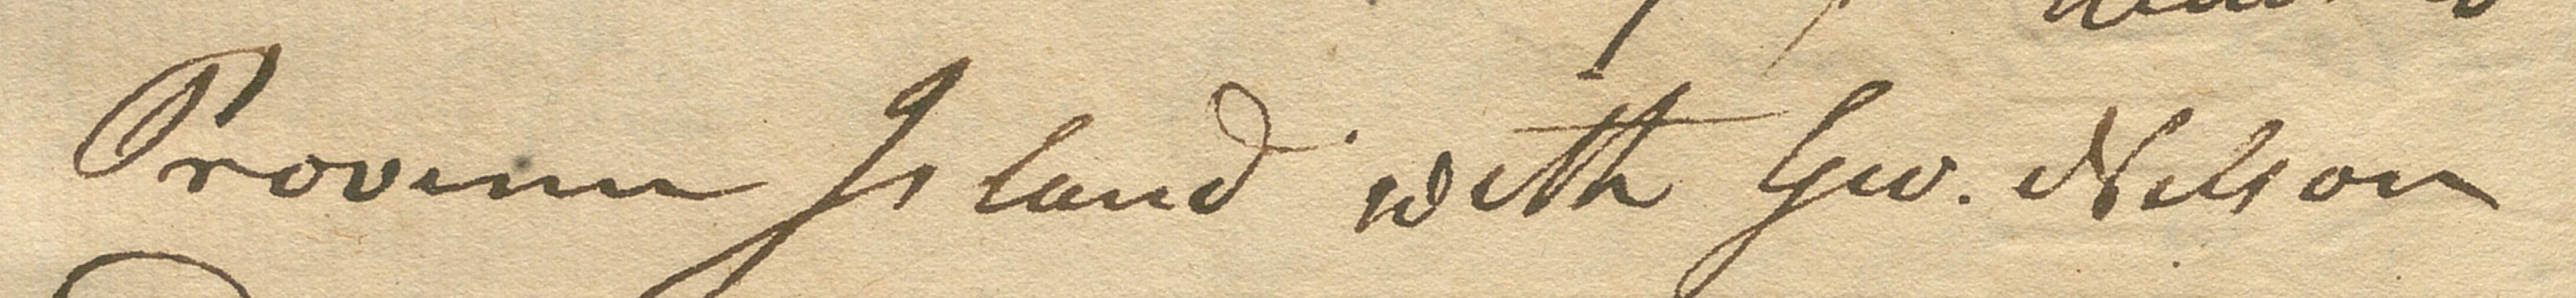Provence Island with Geo. Nelson
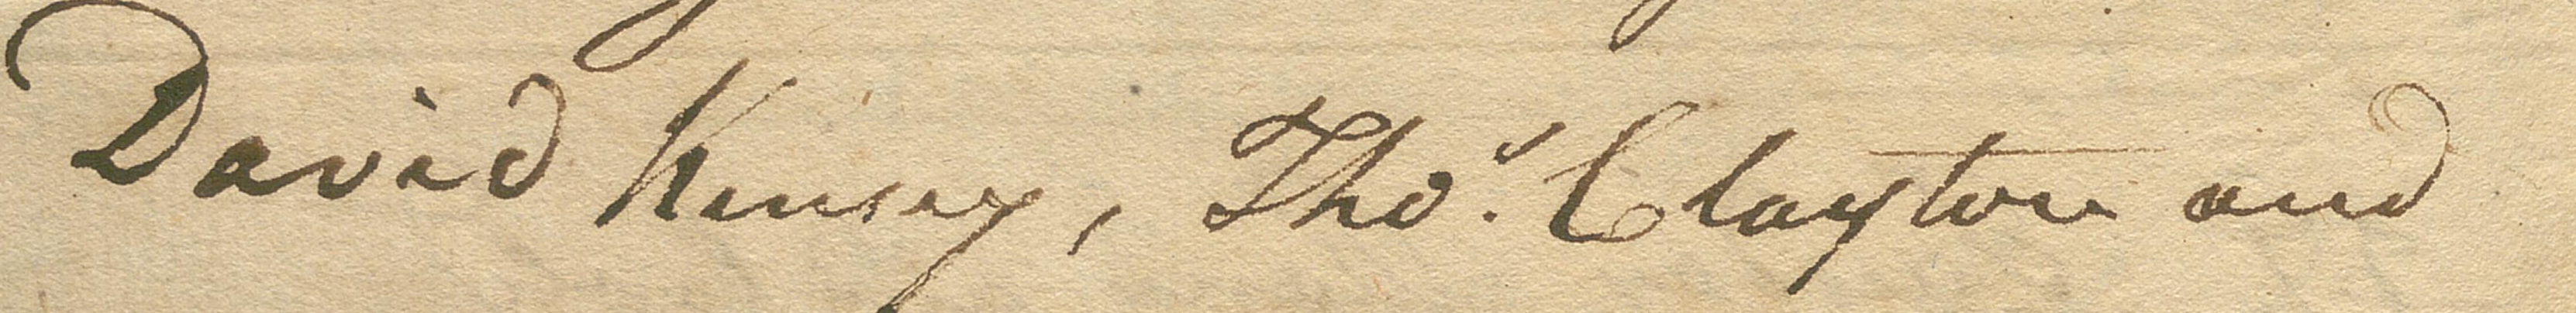Daved Kinsey, Tho^s. Clayton and
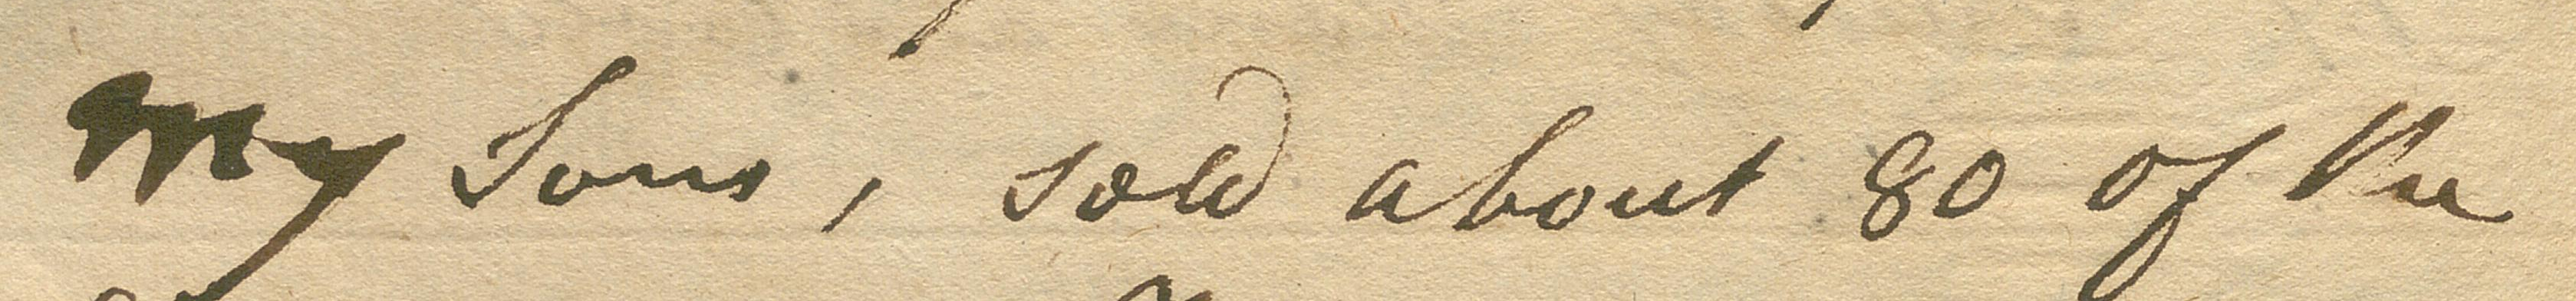My Sons, sold about 80 of the
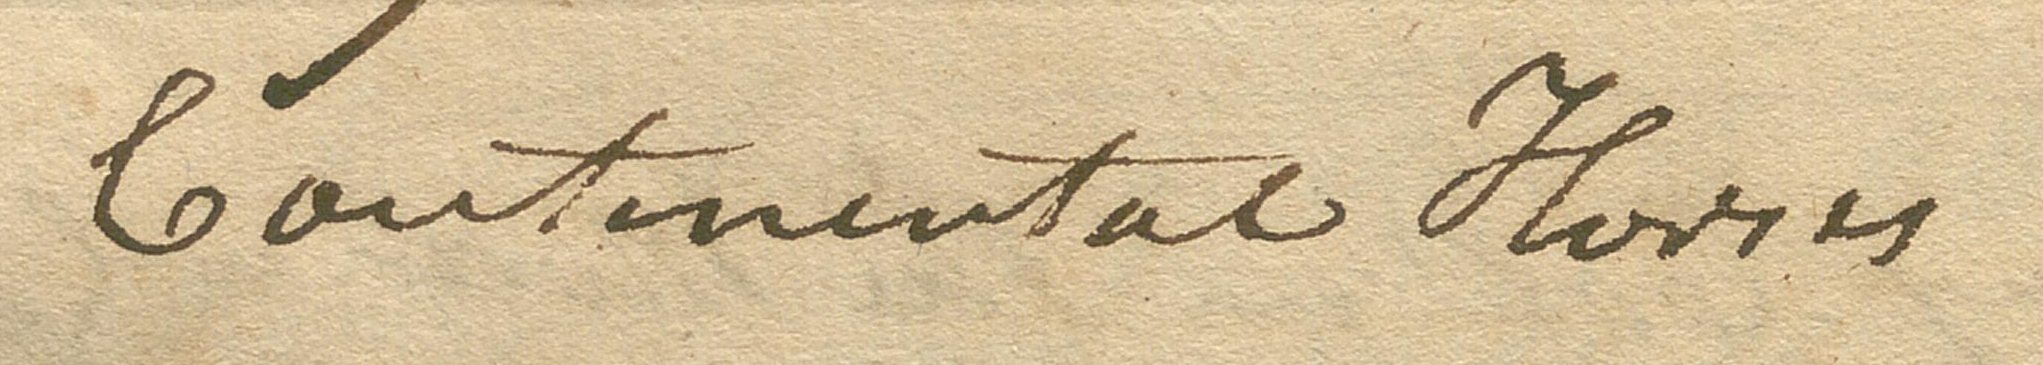Continental Horses
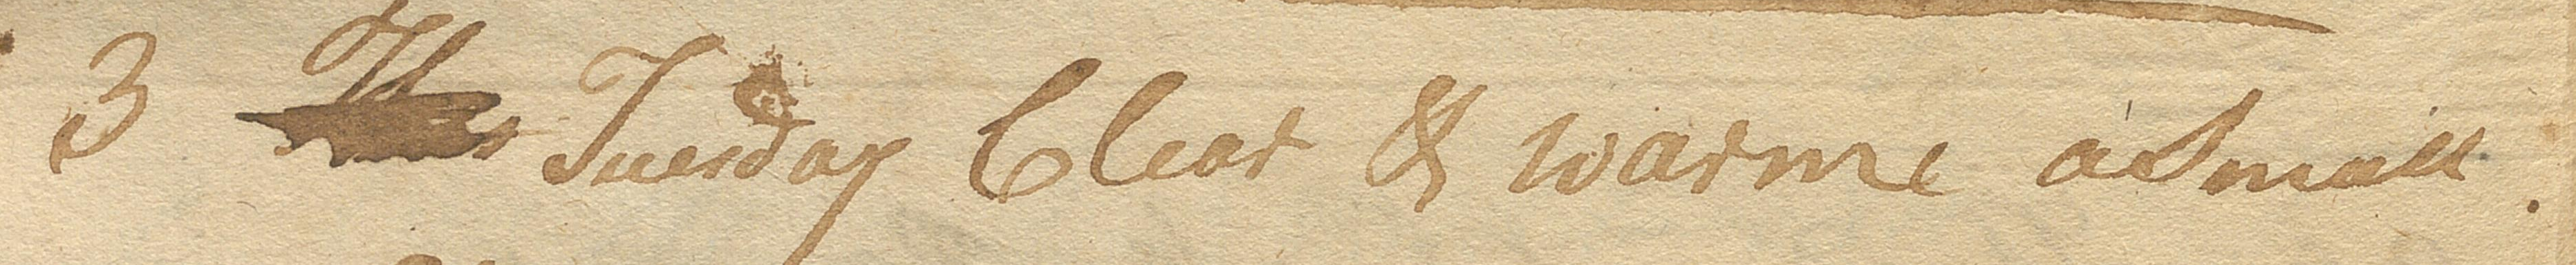3 [Thur] Tuesday Clear & warme a small
